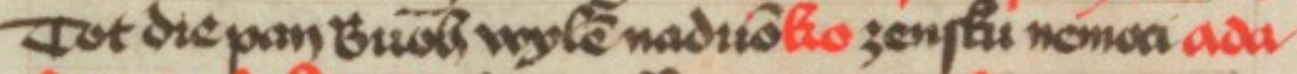Tot die pan Buoh wylȇ naduȏko zenſku nemoci ada-
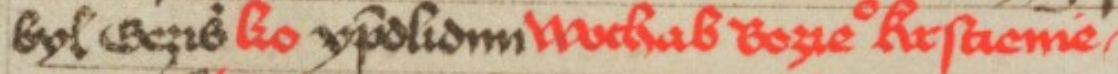byl Geziṡ ko yp̄olidmi Wochab Bozie° Krſtienie
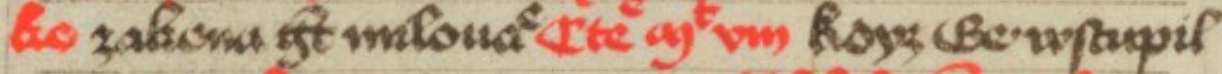ko zakona g̑t milouae Cte° mt viii kdyz Ge wſtupil
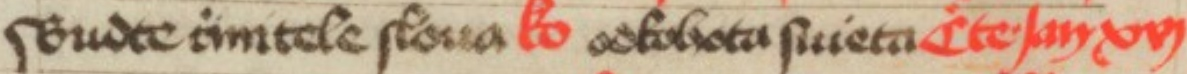Budte ċinitele ſloua ko odkohota ſuieta Ċte·Jan xvj
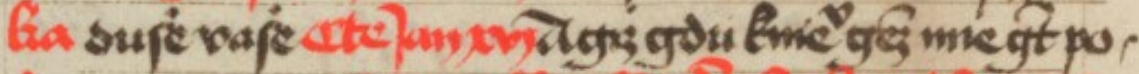ka duẛe vaẛe Cte Jan xvi Agiz gdu kniev gȇz mie g̑t po
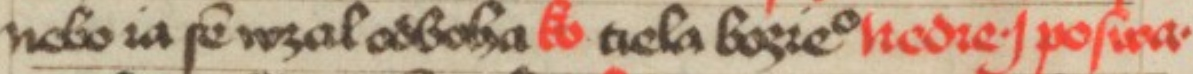nebo ia ſȇ wzal odboha ko tiela bozie° Nedie. J poſwa.
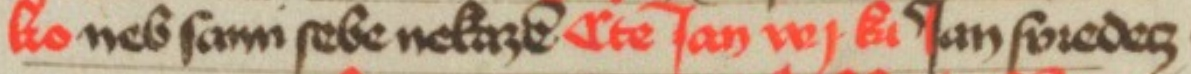ko neb ſami ſebe nekazȇ Ċte Jan wj ka Jan ſviedecz-
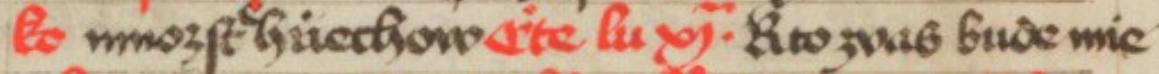ko mnozſt hṙiechow Ċte lu xj. Kto zvas bude mie-
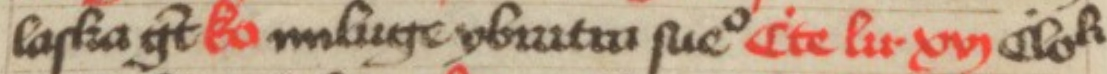laſka g̑t ko miluge ybratra ſue° Ċte lu.xvj Ċlok
